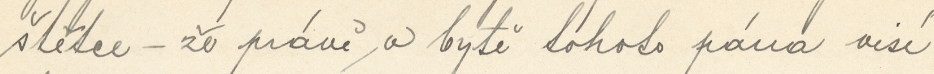štětce - že právě v bytě tohoto pána visí
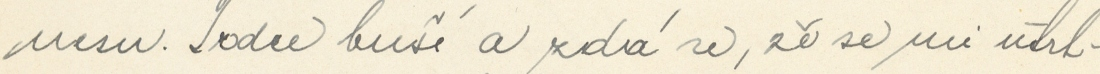nesu. Srdce buší a zdá se, že se mi utrh-
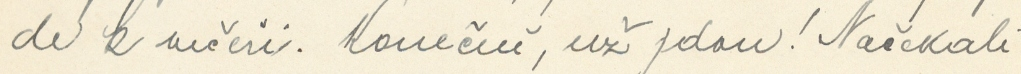de k večeři. Konečně, už jdou! Načekali
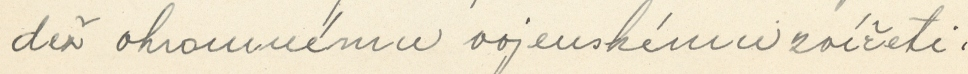dež ohromnému vojenskému zvířeti.
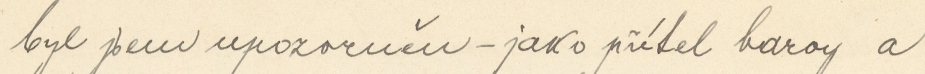byl jsem upozorněn - jako přítel barvy a
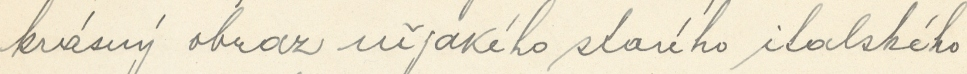krásný obraz nějakého starého italského
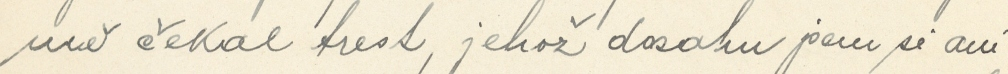mě čekal trest, jehož dosahu jsem si ani
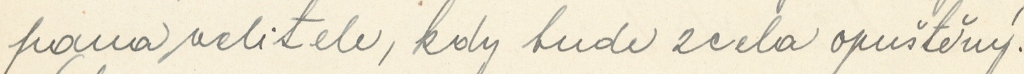pana velitele, kdy bude zcela opuštěný.
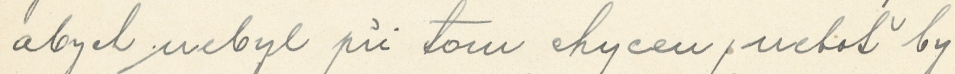abych nebyl při tom chycen, neboť by
